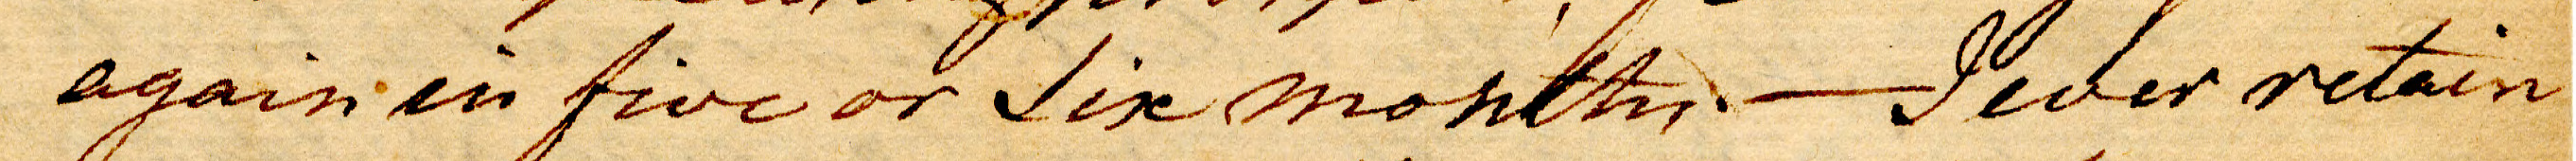again in five or six months.- I ever retain
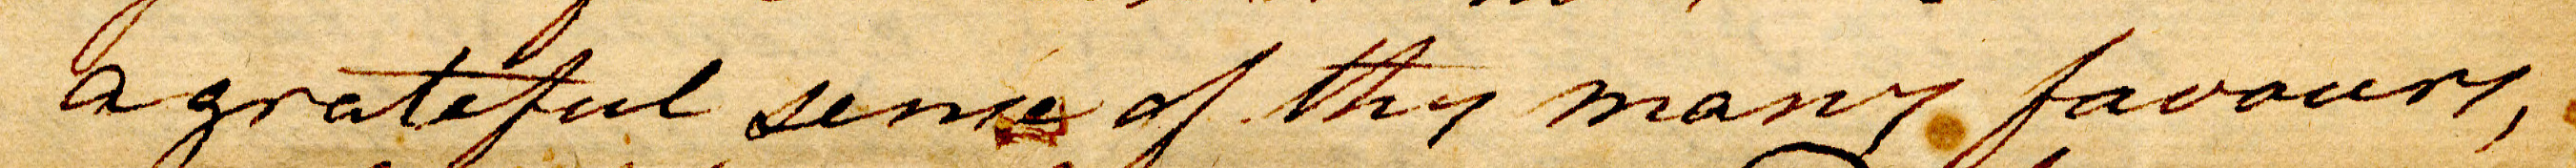a grateful sense of thy many favours,
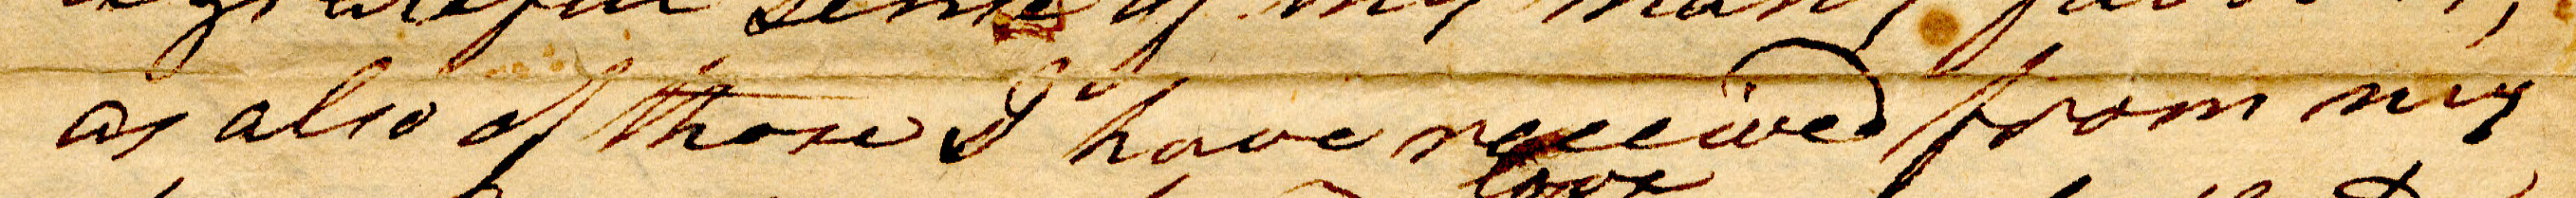as also of those I have received from my
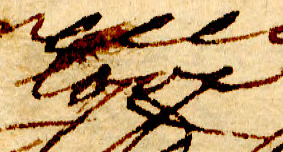love
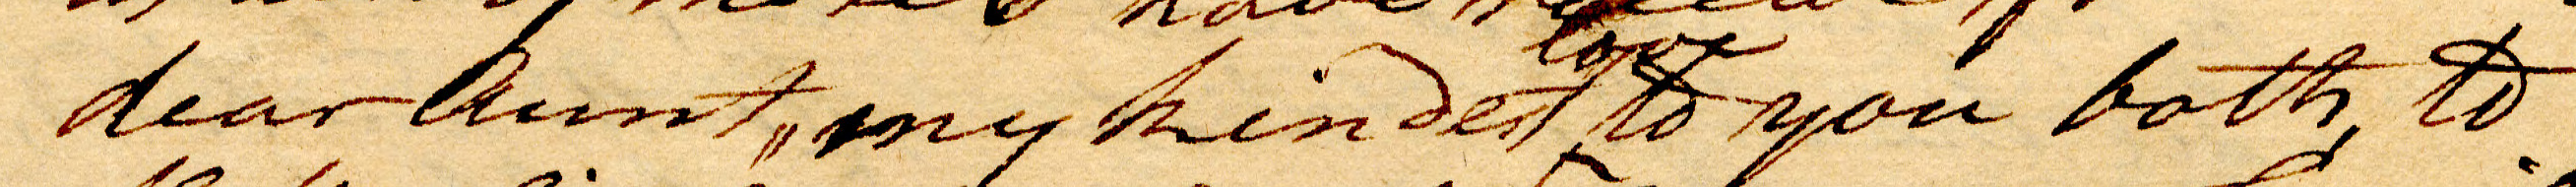dear Aunt, my kindest ^ to you both, to
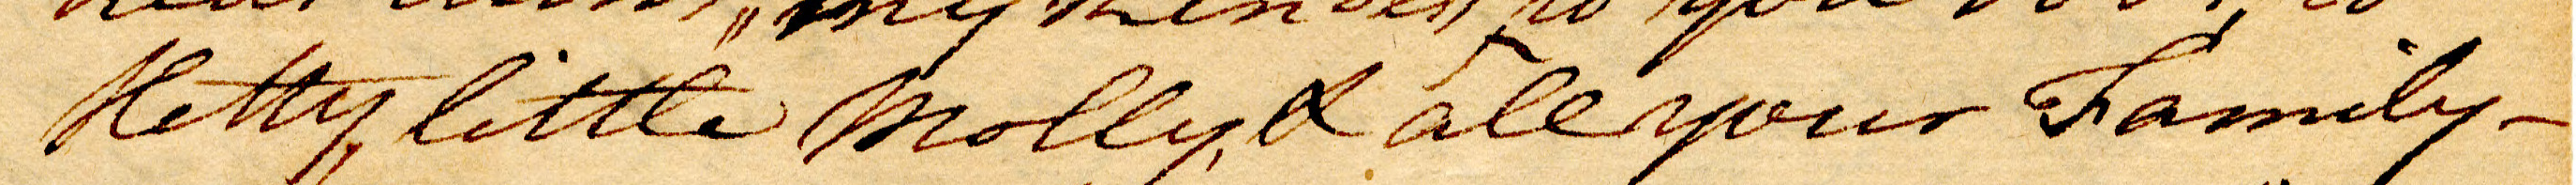Hetty, little Molly, & all your Family-
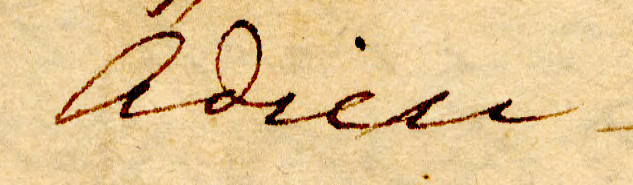Adieu-
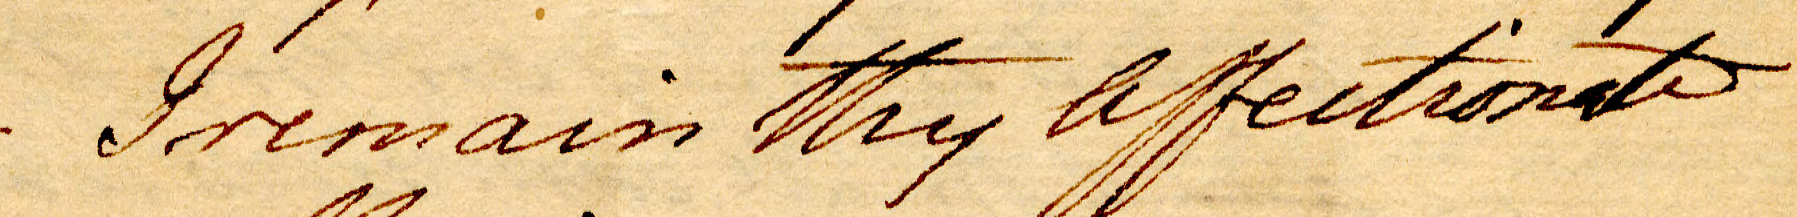I remain thy affectionate
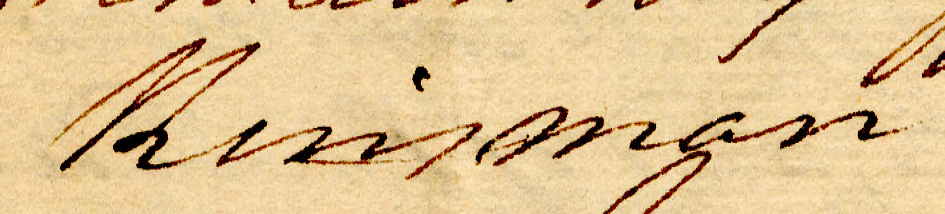Kinsman
